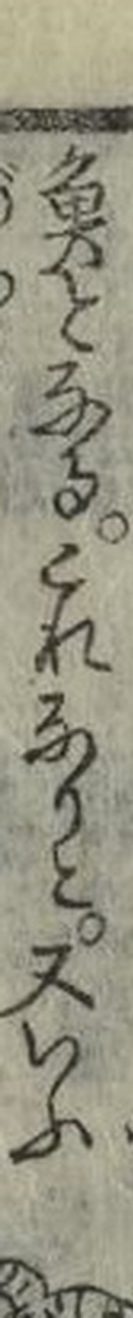魚となる。これなりと。又いふ
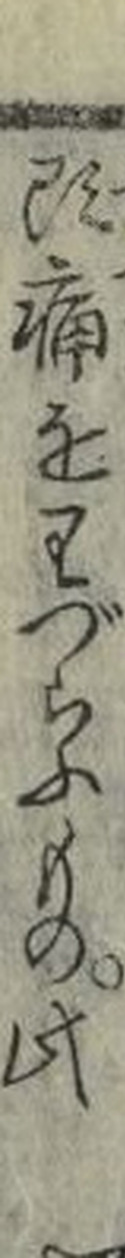頭痛をわづらふもの。此
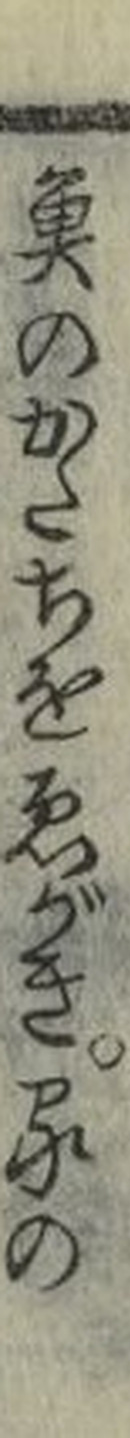魚のかたちをゑがき。家の
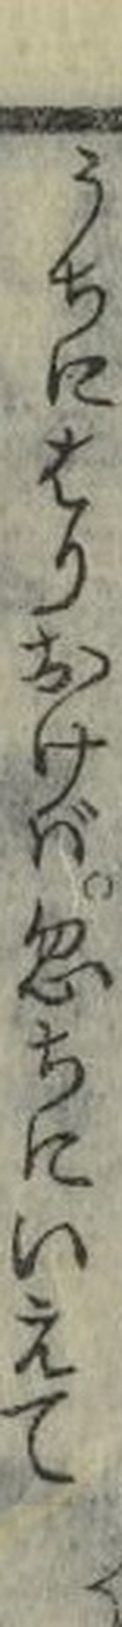うちにはりおけば。忽ちにいえて
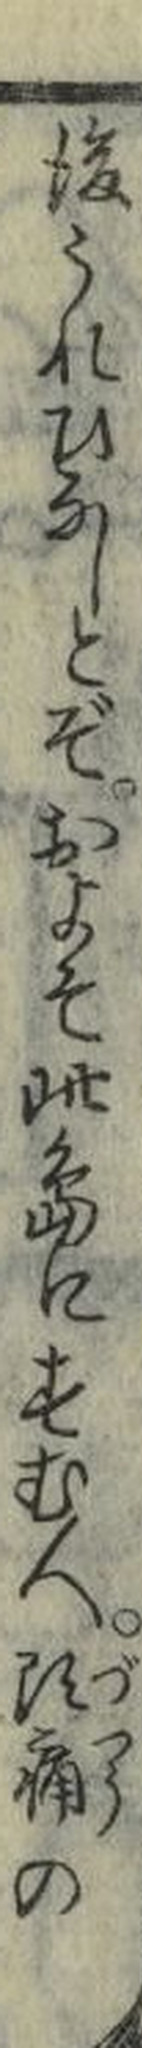後うれひなしとぞ。およそ此島にすむ人。頭痛の
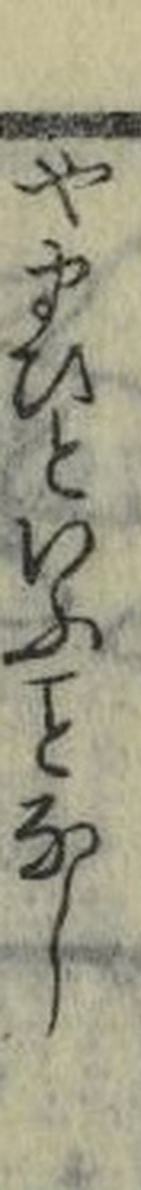やまひといふことなし。
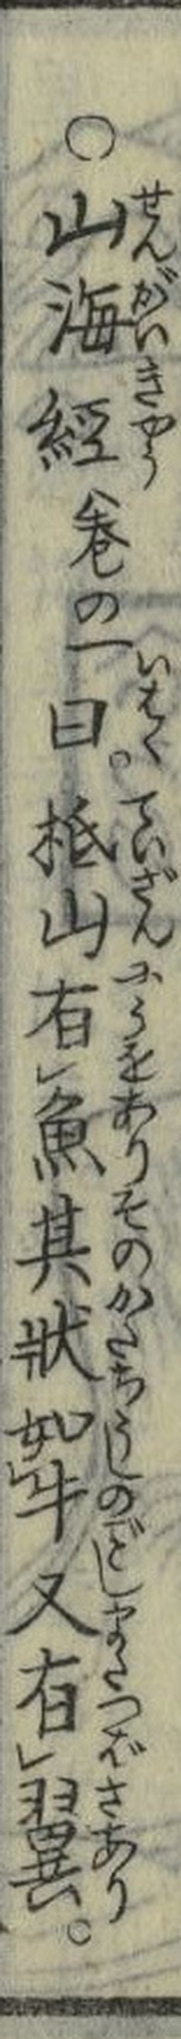○山海経巻の一曰。柢山有魚其状如牛又有翼。
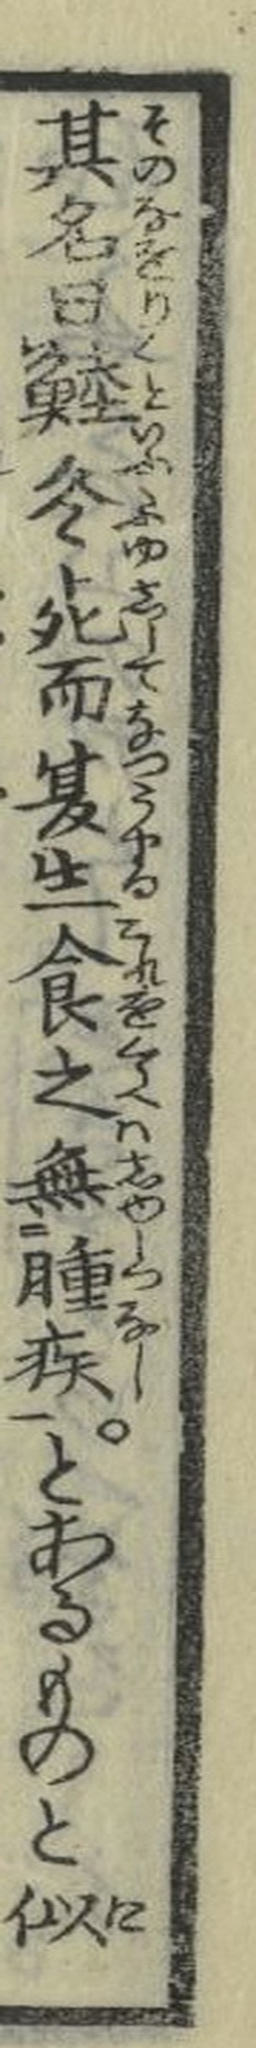其名曰鯥冬死而夏生食之無腫疾。とあるものと似
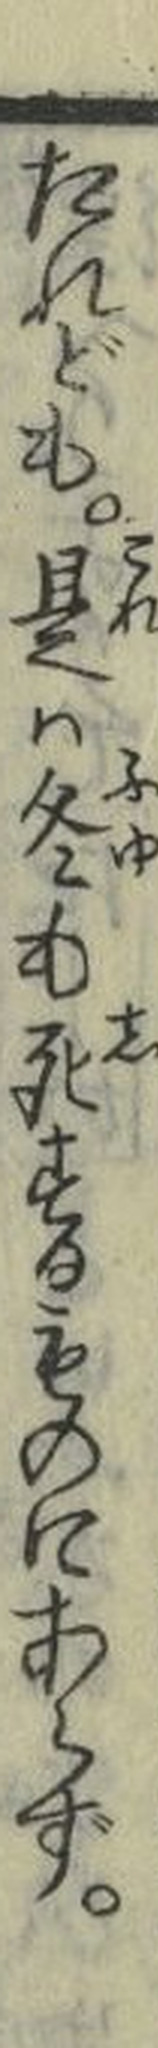たれども。是は冬も死するものにあらず。
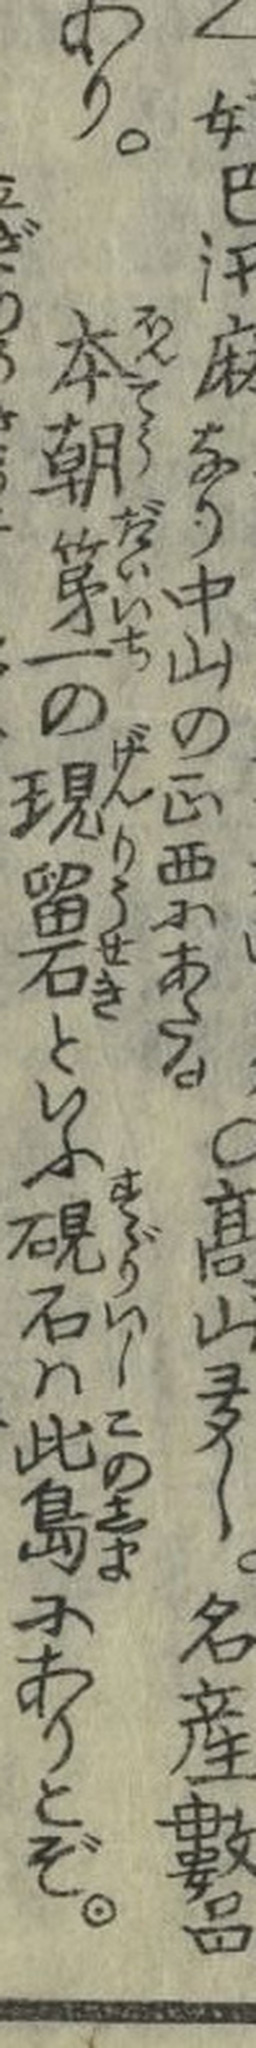あり。本朝第一の現留石といふ硯石は此島にありとぞ。
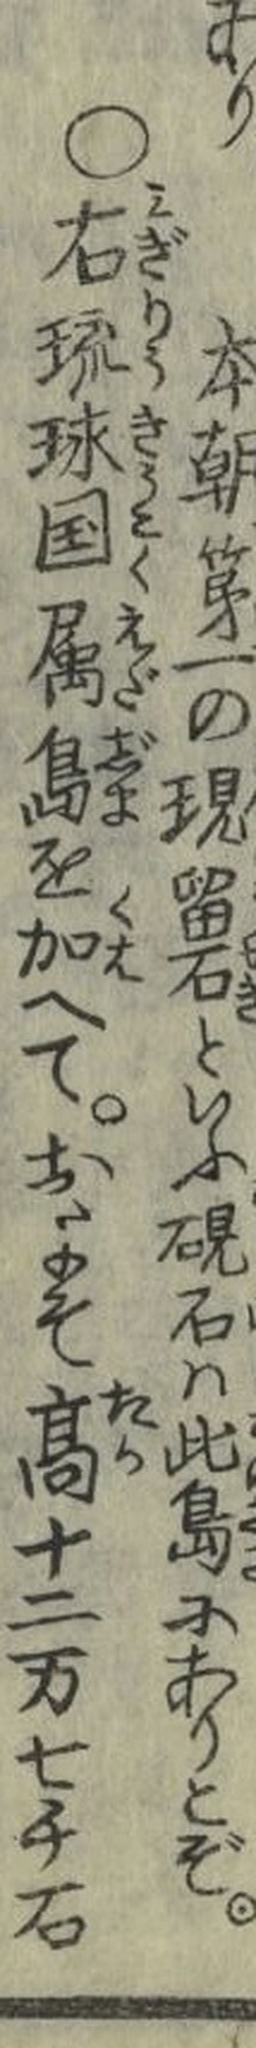○右琉球国属島を加へて。およそ高十二万七千石
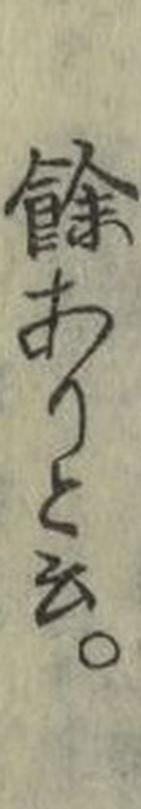余ありと云。

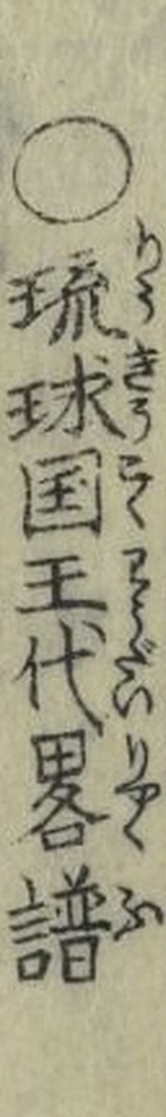○琉球国王代略譜
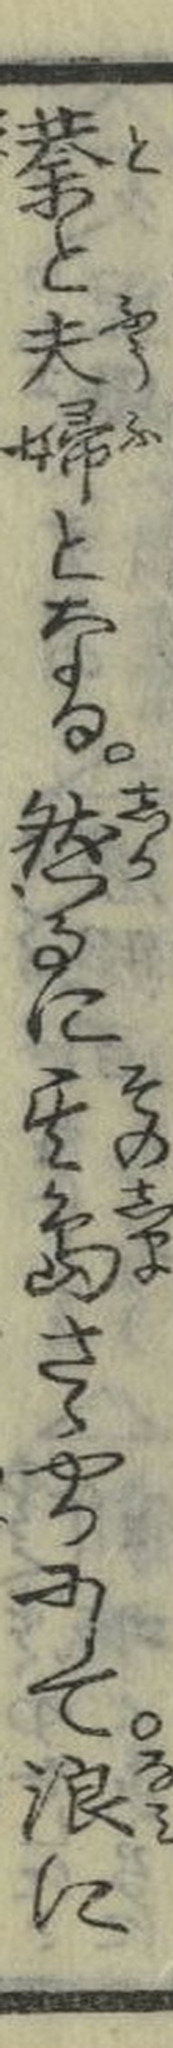荼と夫婦となる。然るに其島さゝやかにして。波に
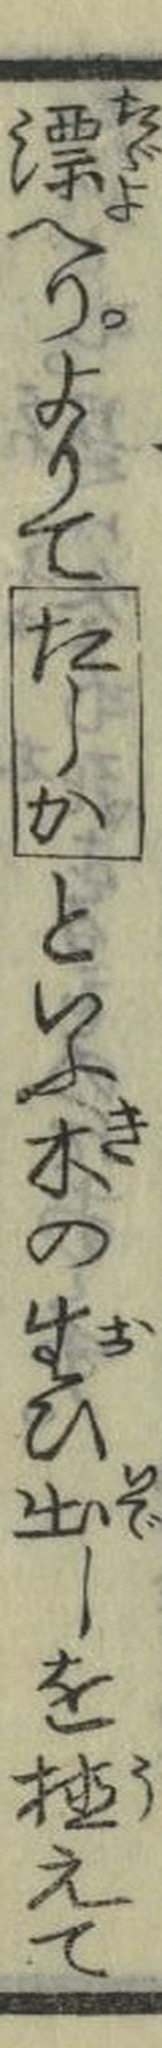漂へり。よりて「たしか」といふ木の生ひ出しを植えて
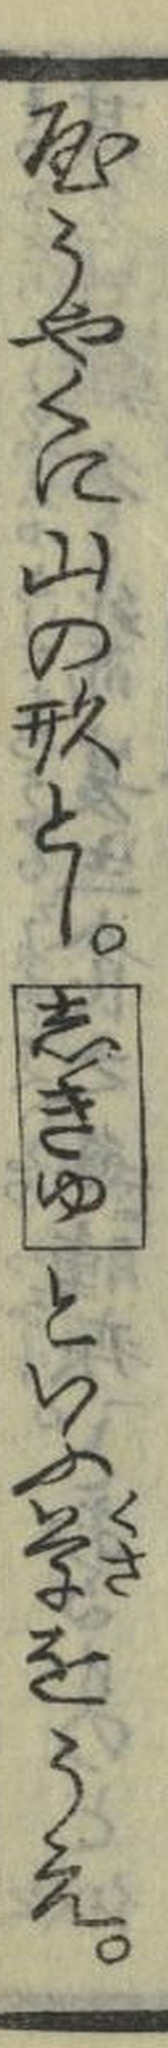やうやくに山の形とし。「しきゆ」といふ草をうえ。
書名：琉球奇譚
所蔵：University of the Ryukyus Library
